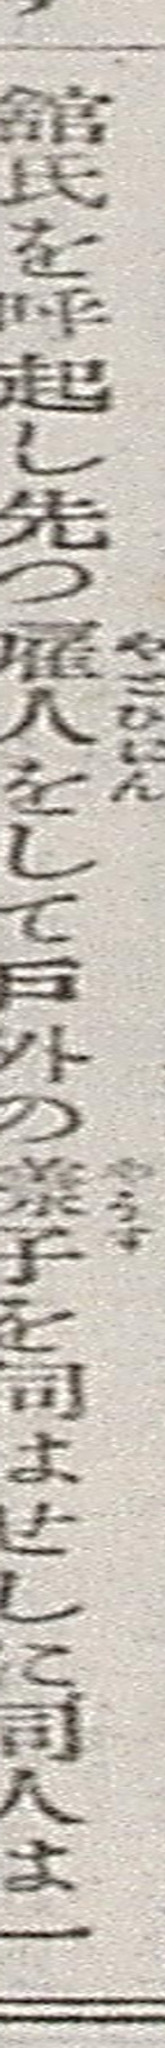舘氏を呼起し先づ雇人をして戸外の様子を伺はせしに同人は一
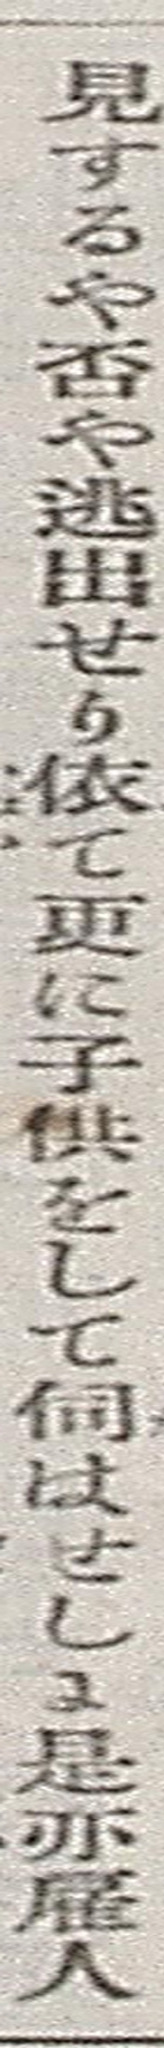見するや否や逃出せり依て更に子供をして伺はせしに是亦雇人
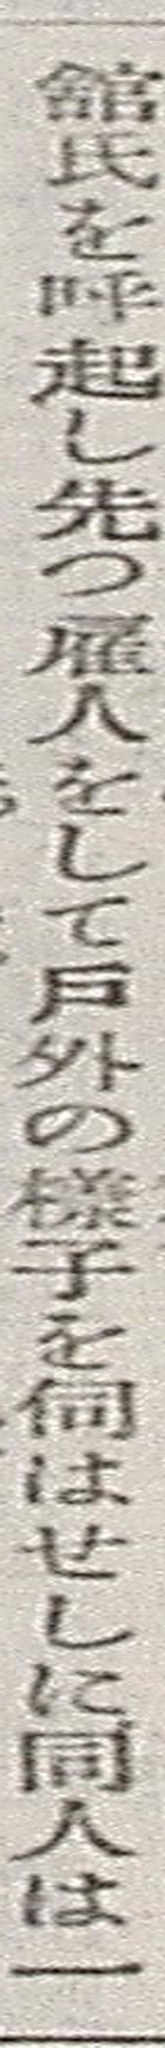舘氏を呼起し先づ雇人をして戸外の様子を伺はせしに同人は一
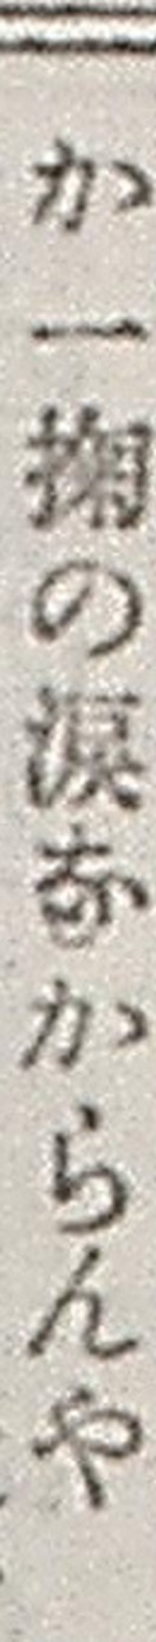か一掬の涙なからんや
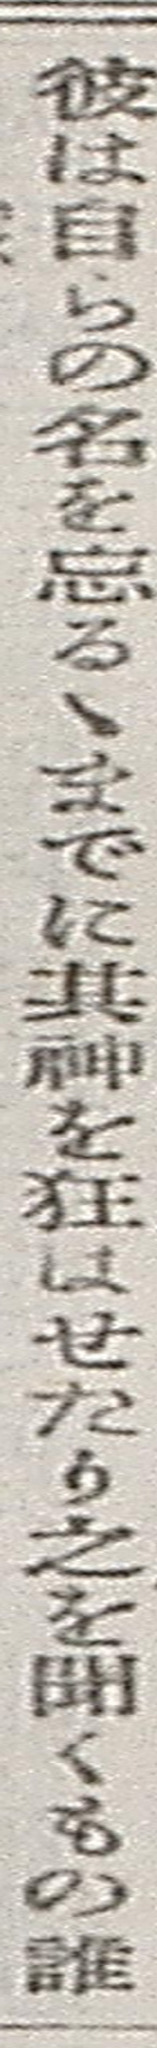彼は自らの名を忘るゝまでに其神を狂はせたり之を聞くもの誰
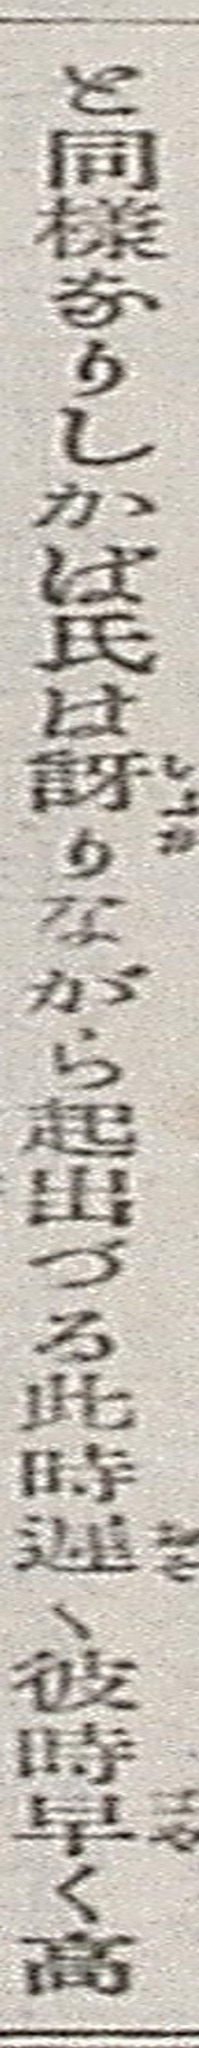と同様なりしかば氏は訝りながら起出づる此時遅く彼時早く高
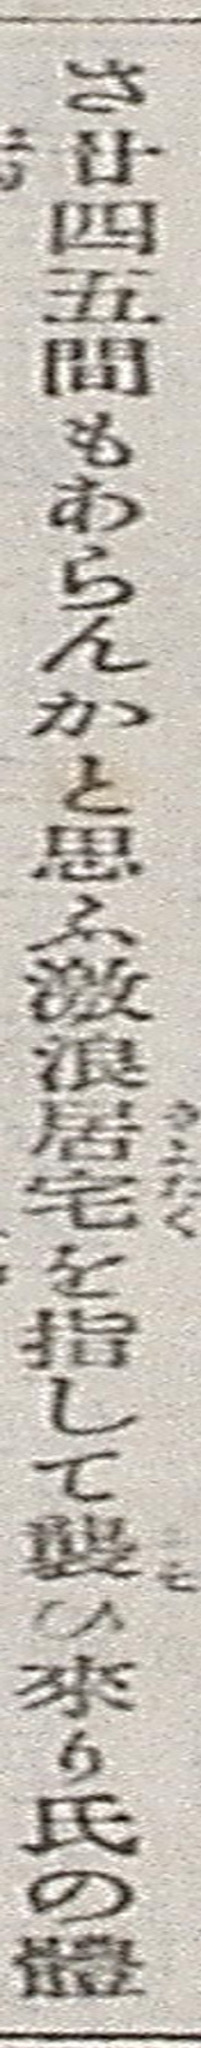さ廿四五間もあらんかと思ふ激浪居宅を指して襲ひ来り氏の体
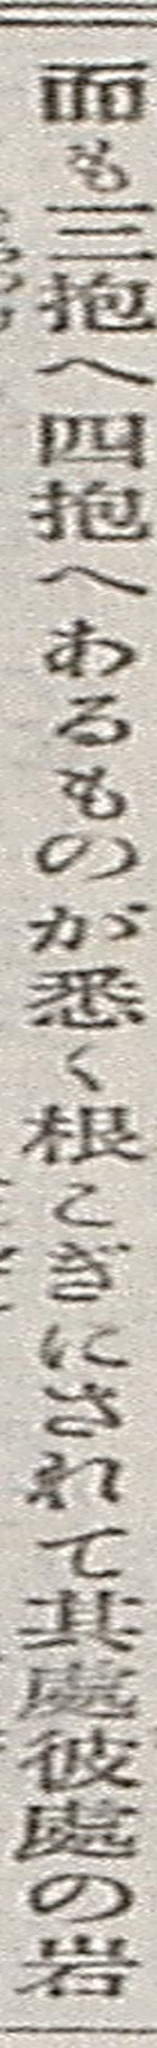而も三抱へ四抱へあるものが悉く根こぎにされて其処彼処の岩
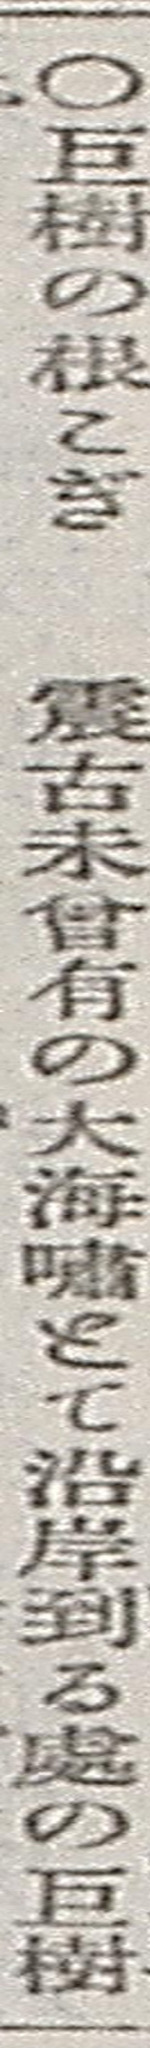○巨樹の根こぎ震古未曽有の大海嘯とて沿岸到る処の巨樹
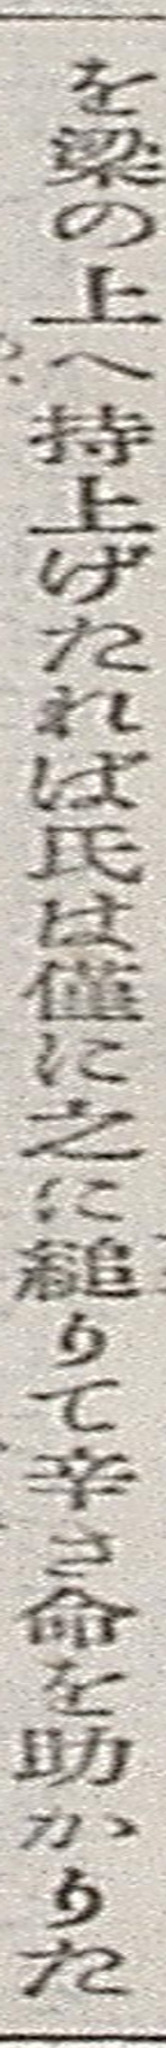を梁の上へ持上げたれば氏は僅に之に縋りて辛き命を助かりた
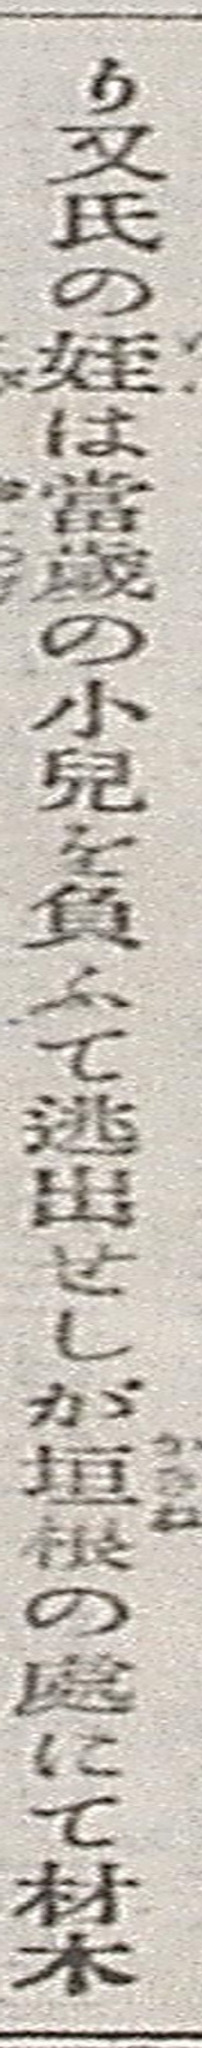り又氏の姪は当歳の小兒を負ふて逃出せしが垣根の処にて材木
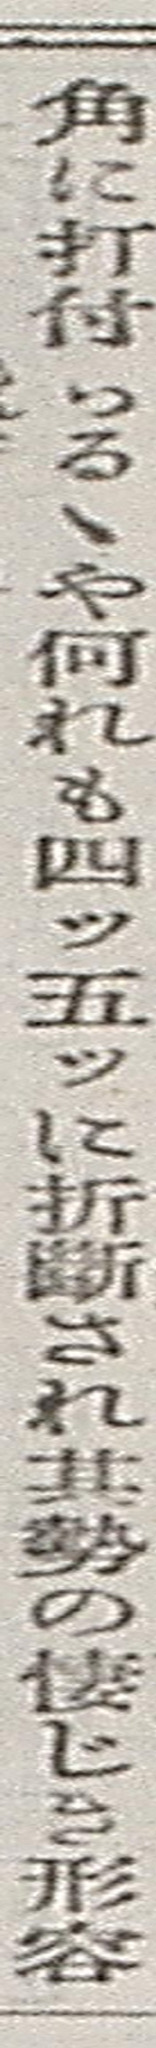角に打付らるゝや何れも四ッ五ッに折断され其勢の凄じき形容
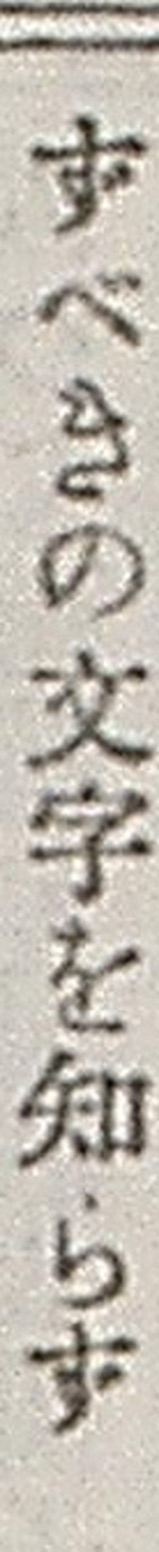ずべきの文字を知らず
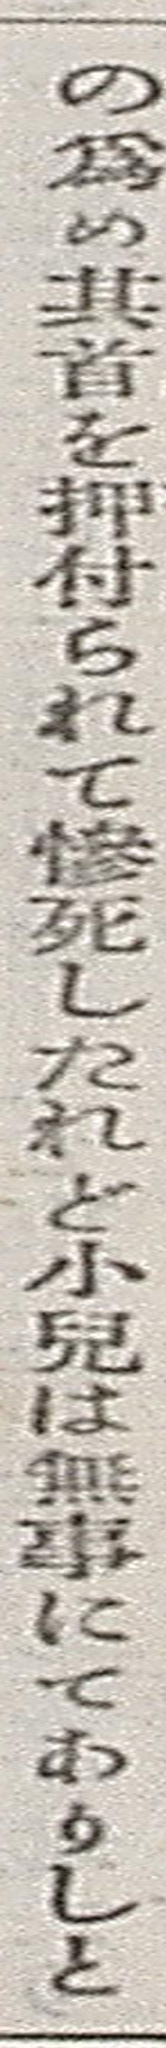の為め其首を押付られて惨死したれど小兒は無事にてありしといふ
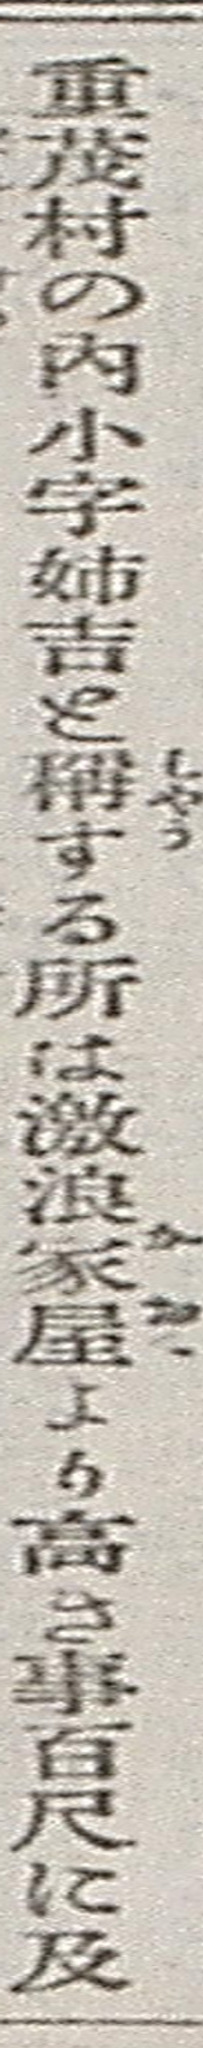重茂村の内小字姉吉と称する所は激浪家屋より高き事百尺に及
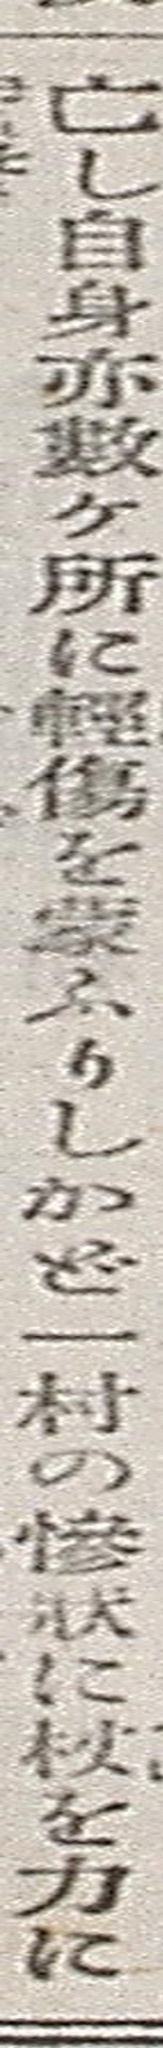亡し自身亦数ヶ所に軽傷を蒙ふりしかど一村の惨状に杖を力に
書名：風俗畫報臨時増刊第百二十號　大海嘯被害録（下）
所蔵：東京大学地震研究所図書室 Earthquake Research Institute Library, The University of Tokyo, JAPAN
